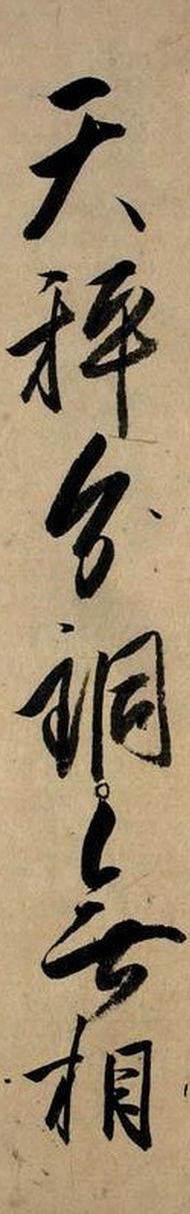天秤分銅無相
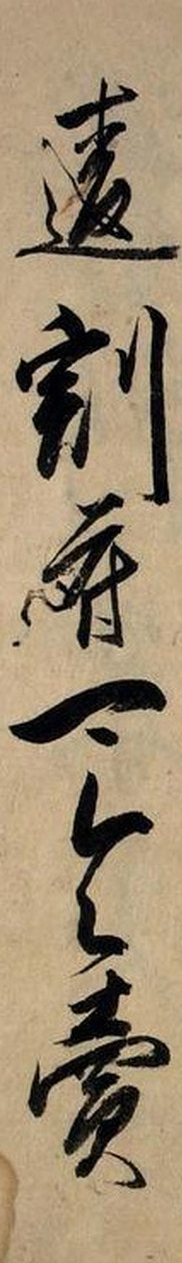違割府可令売
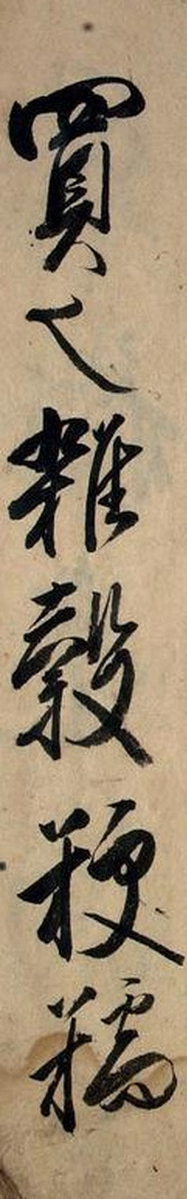買也雑穀粳糯

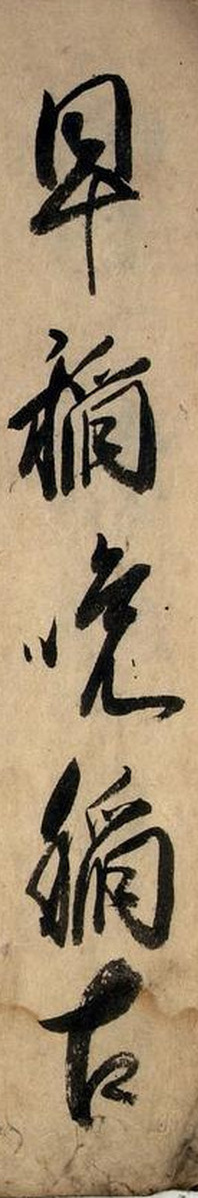早稲晩稲古
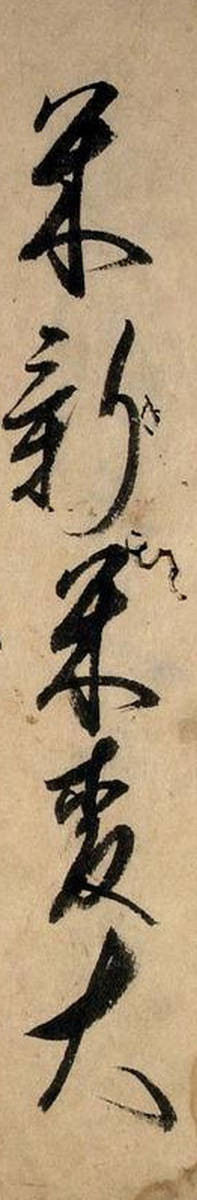米新米麦大
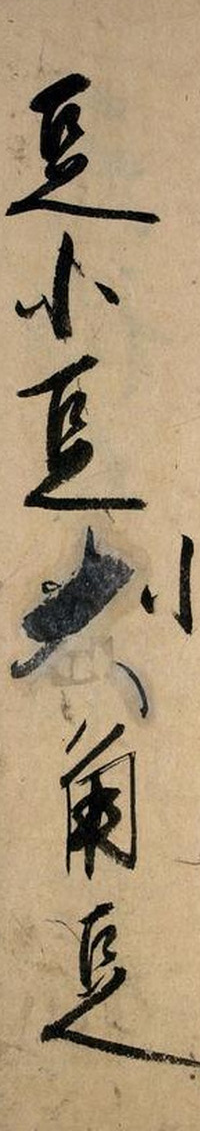豆小豆大角豆
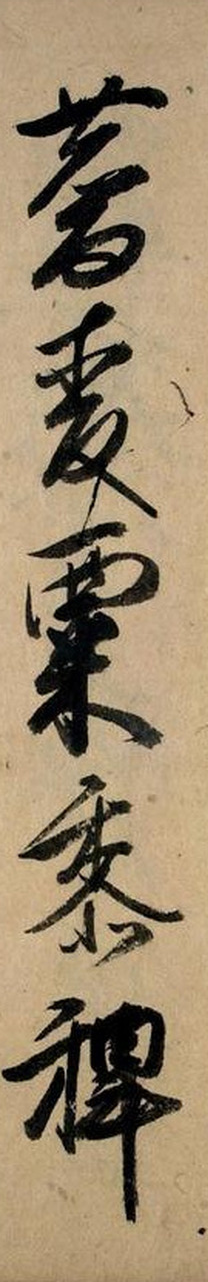蕎麦粟黍稗
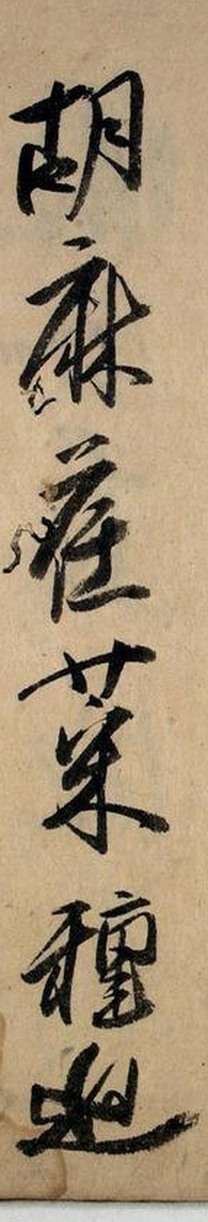胡麻荏菜種廻

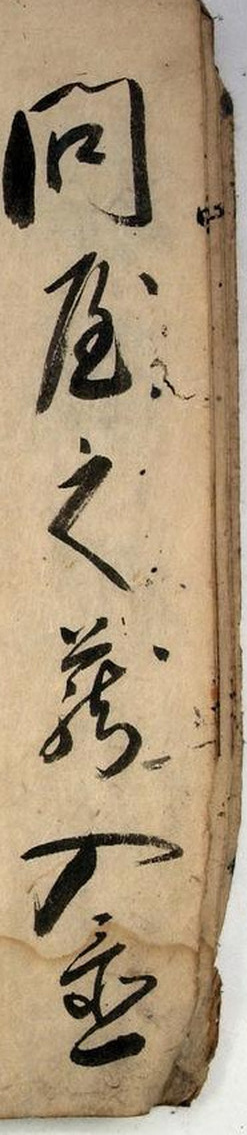問屋之蔵入置
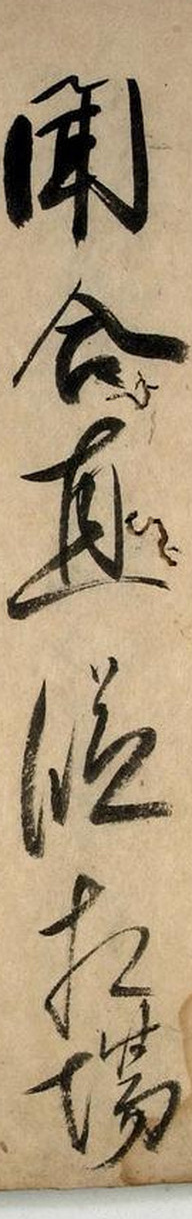聞合直段相場
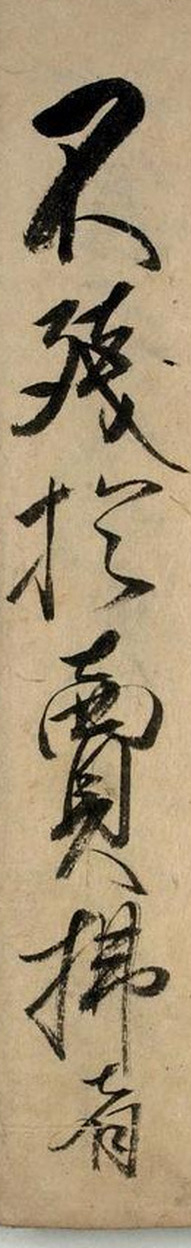不残於売払は
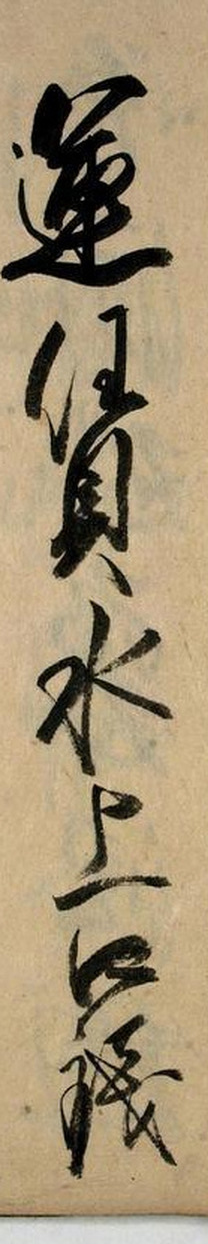運賃水上口銭
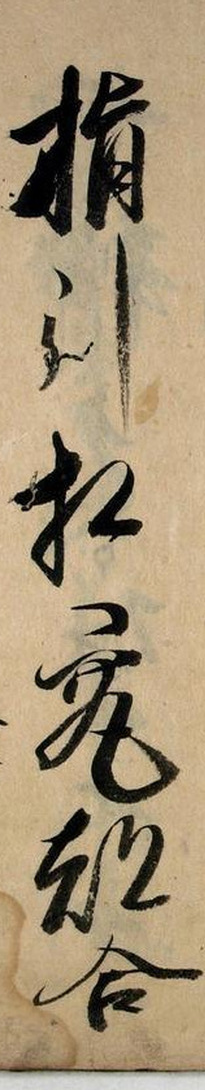指引相究都合
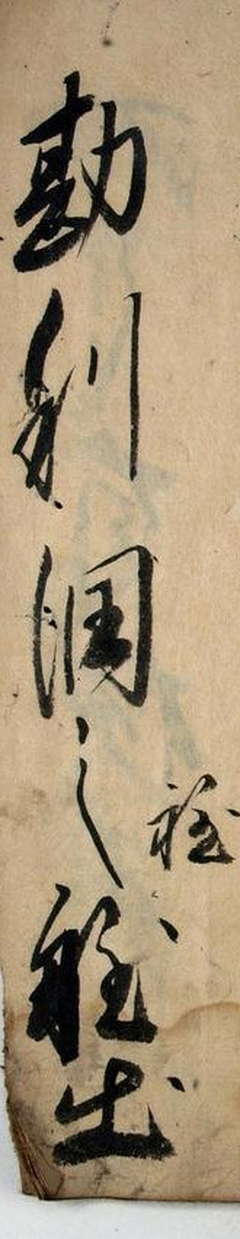勘利潤之程出

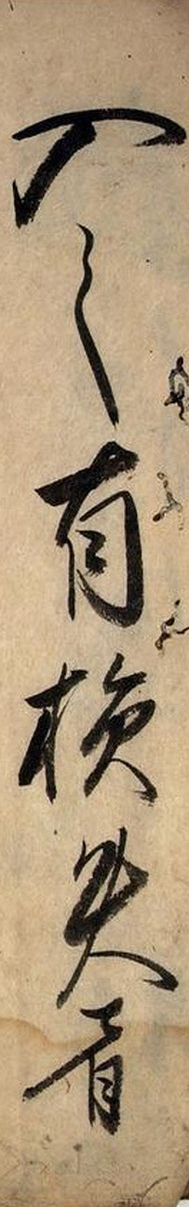入之有損失は
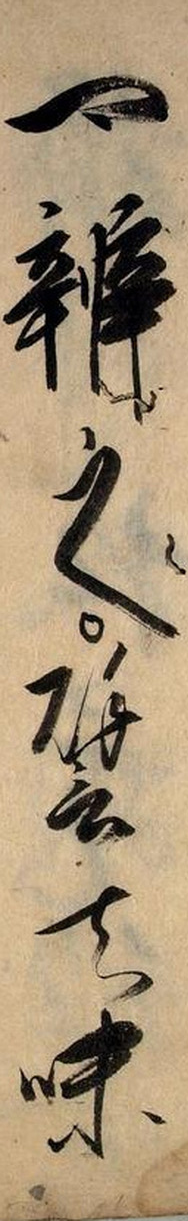可弁之。譬は味
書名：商売往来（往来物、手習、市之助・市兵衛の名もあり）
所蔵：福井県文書館 Fukui Prefectural Archives
